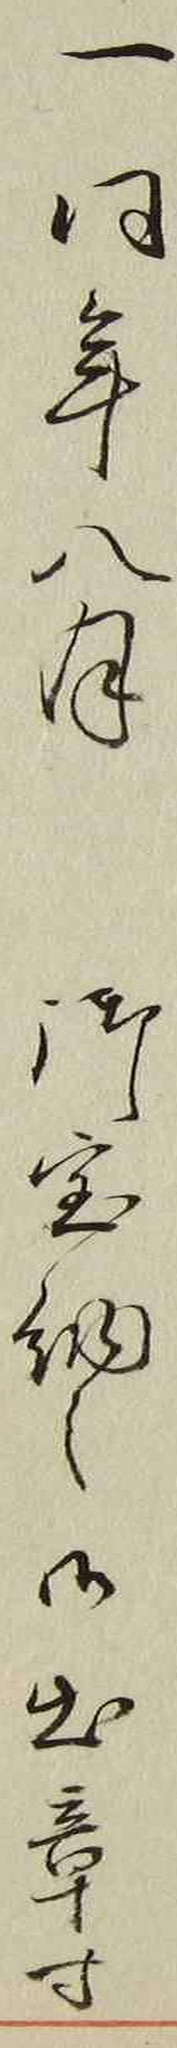一同年八月御宝納御出章寸
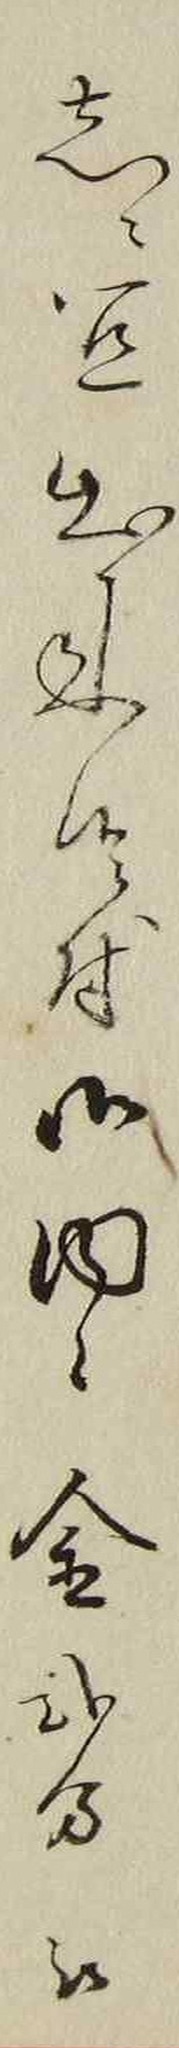志ニ宜出来候ニ付御内々金弐分被
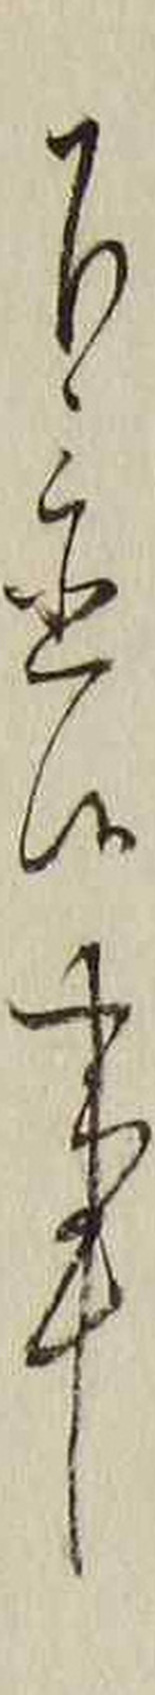下置候事
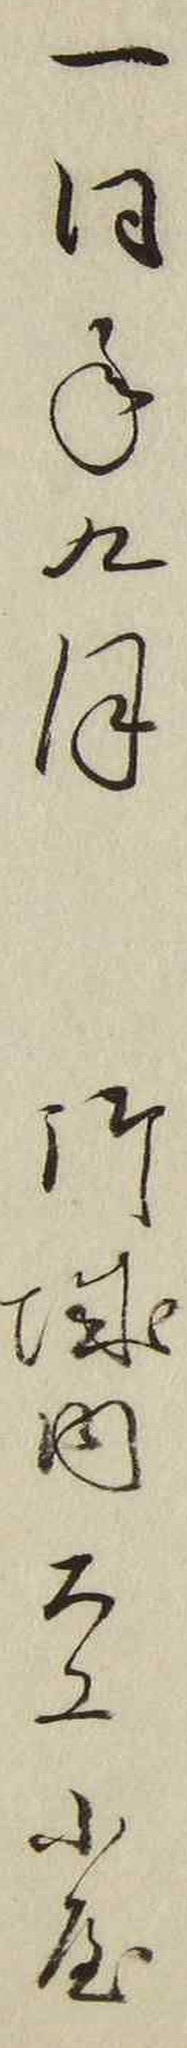一同年九月御城内大工小屋

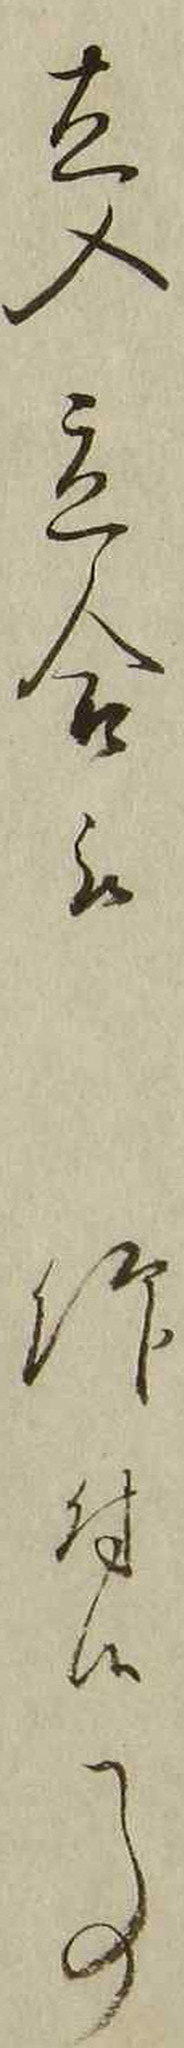立入立合被仰付候事
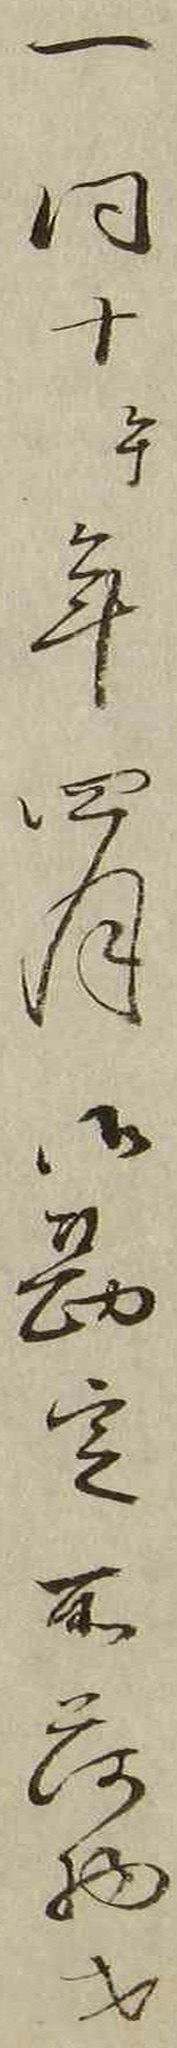一同十午年四月御勘定所荷物才
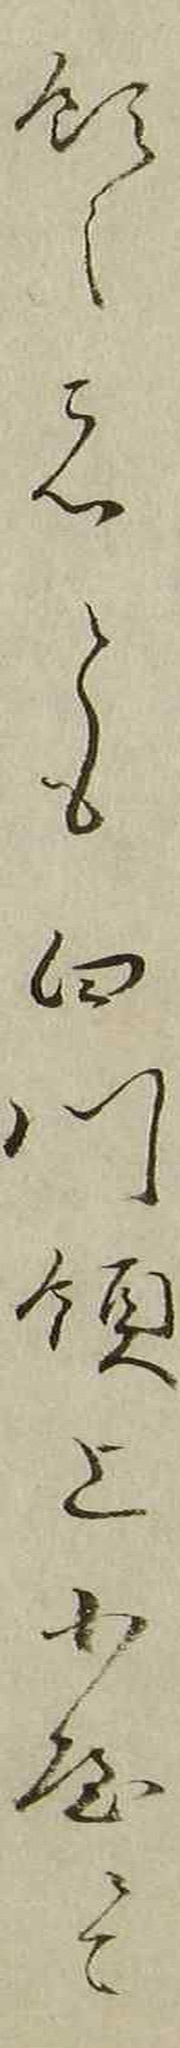領之者とも白川領上小屋ニて
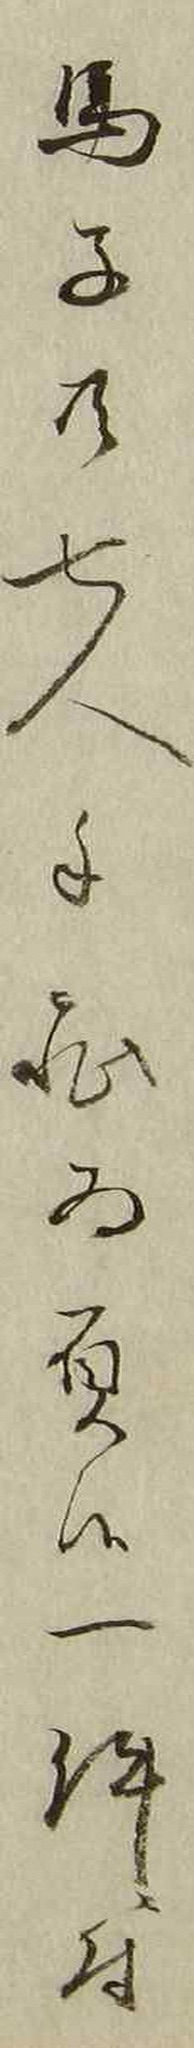馬子共七人手疵為負候一件ニ付
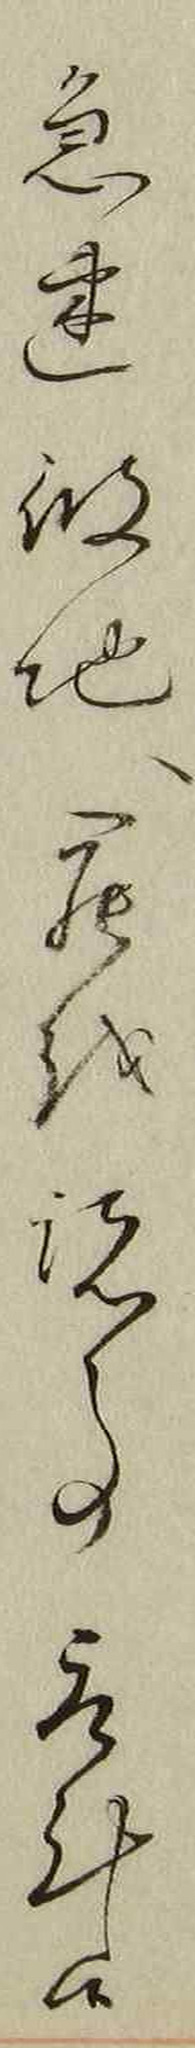急速彼地へ罷越諸事取計候
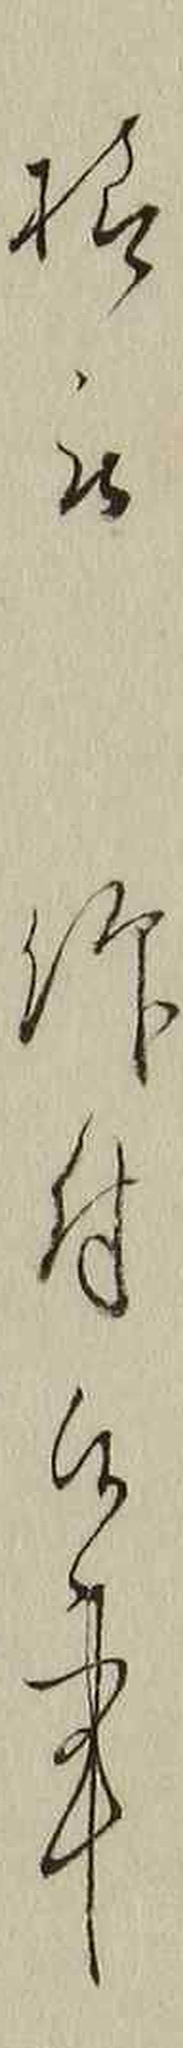様被仰付候事
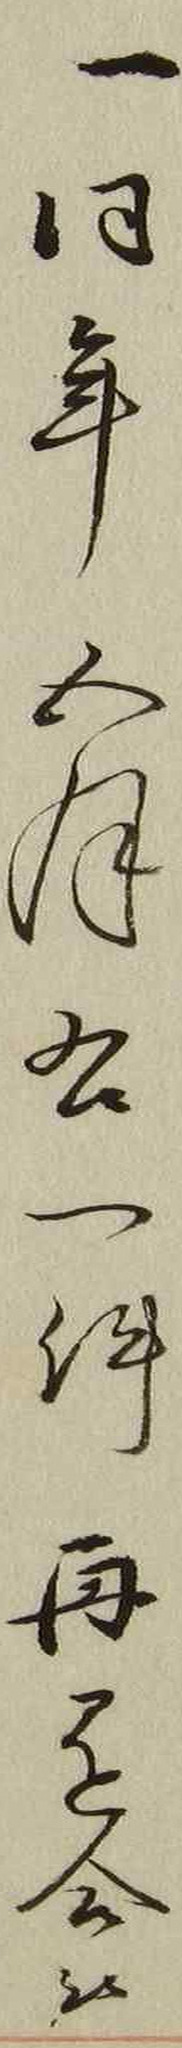一同年五月右一件再懸合被
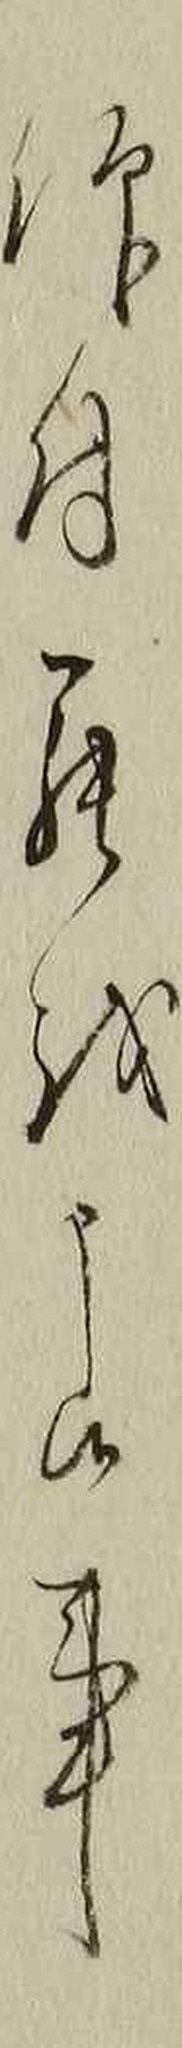仰付罷越申候事
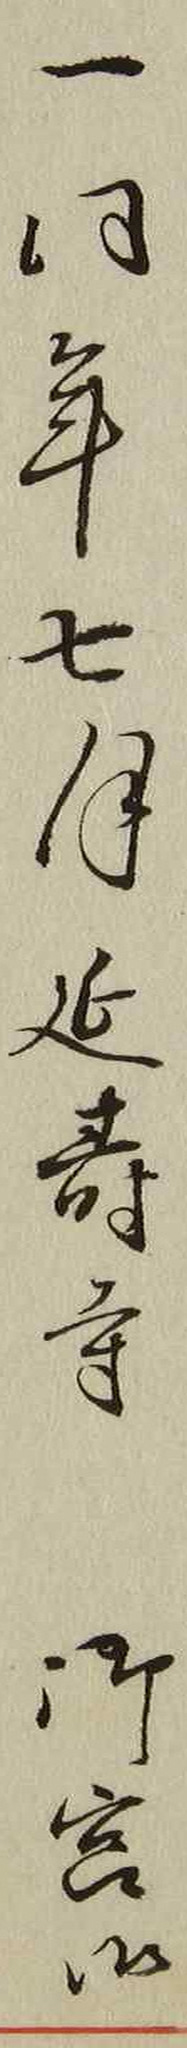一同年七月延寿寺御宮御
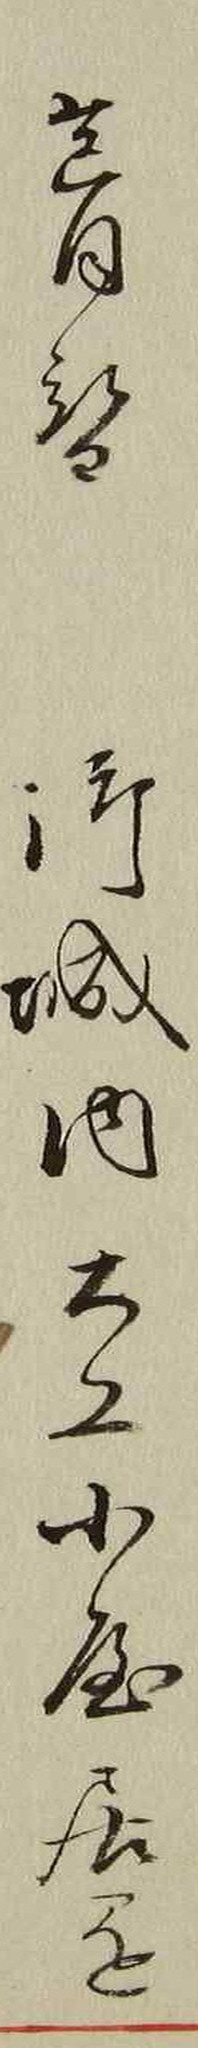葺替御城内大工小屋居懸
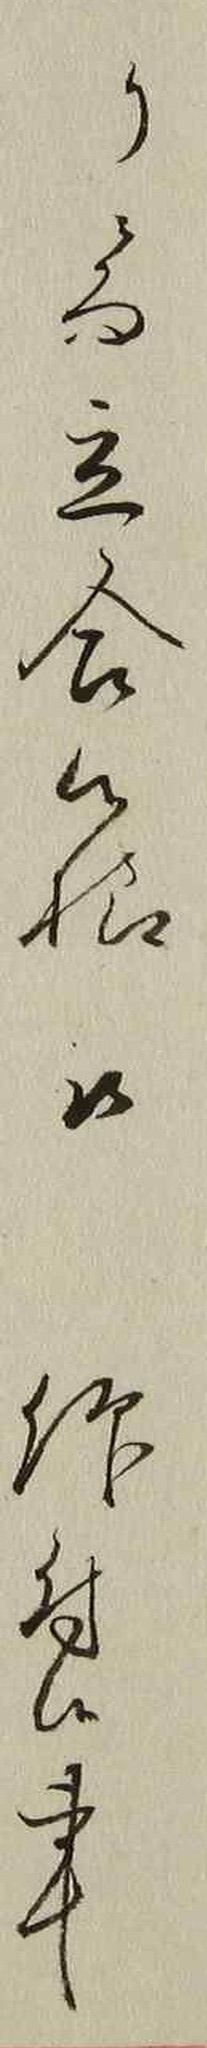りニ而立合候様被仰付候事
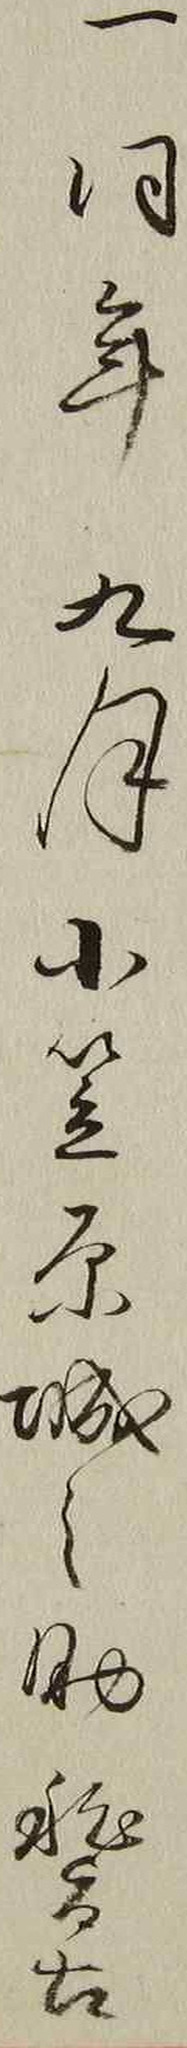一同年九月小笠原城之助稽古
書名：諸士系譜　巻之8　い之部8
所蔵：会津若松市立会津図書館
